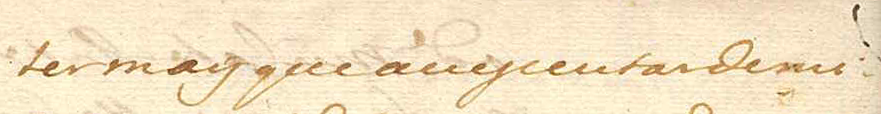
ter mais que acrescentar demi
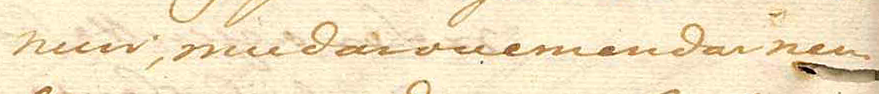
nuir; mudar ou emendar nem
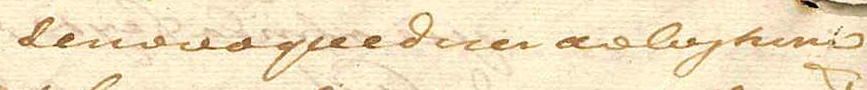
de novo que dizer ao custum
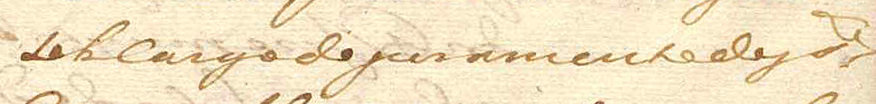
sob cargo do juramento dos s.tos
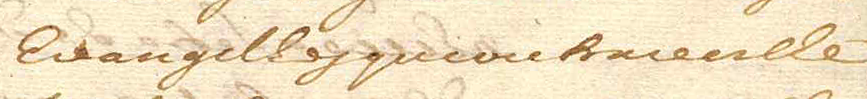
Evangelhos que outra vez lhe
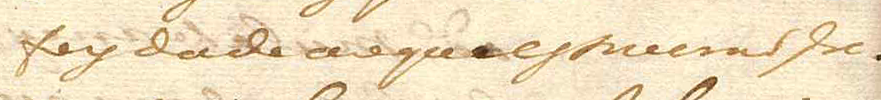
foy dado ao que estiueraõ pre
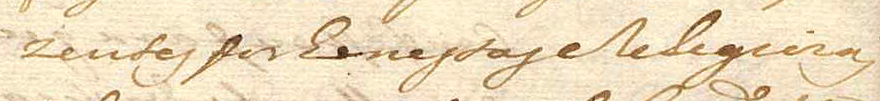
zentes por honestas e Religiozas
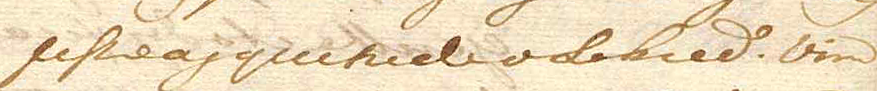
pessoas que tudo o sobred.o viraõ
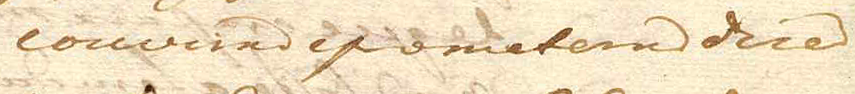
e ouviraõ e pometeraõ dizer
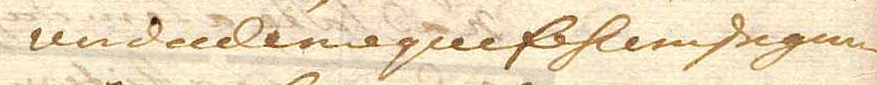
verdade no que fossem pregun
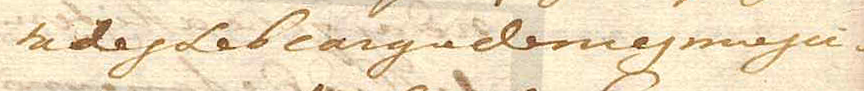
tados sob cargo do mesmo ju
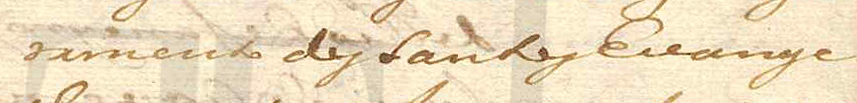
ramento dos santos Evange
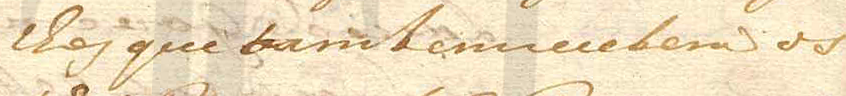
lhos que tambem receberaõ os
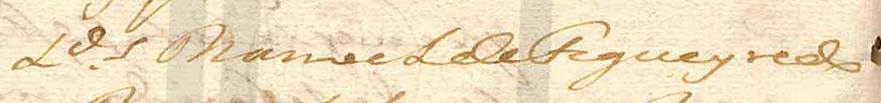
L.os Manoel de Figueyredo
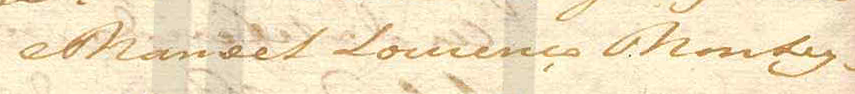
e Manoel Lourenço Montey
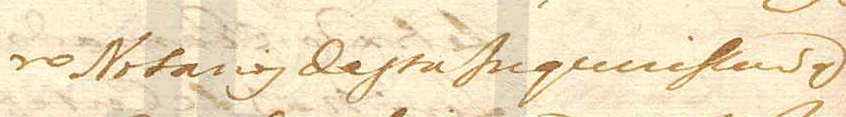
ro Notarios desta Inquizissaõ q̄
